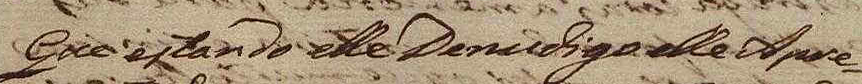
Que estando elle Denu digo elle Apre
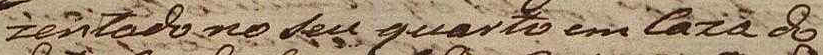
zentado no seu quarto em caza do
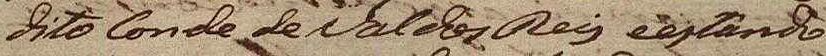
dito Conde de Val dos Reis, e estando
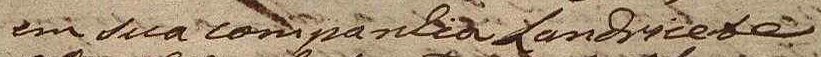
em sua companhia Landricete
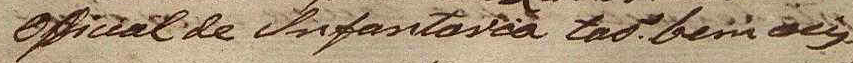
official de Infantaria taõbem acis
